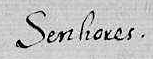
Senhores.
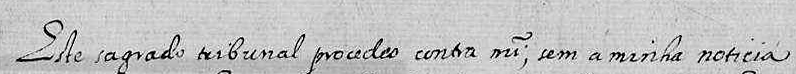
Este sagrado tribunal procedeo contra mī; sem a minha noticia
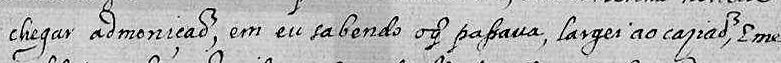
chegar admoniçaõ, em eu sabendo o q̄ passaua, largei a ocaziaõ, E me
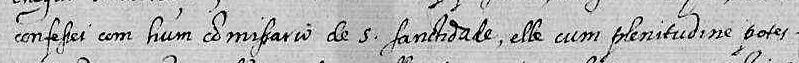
confessei com hum cōmissario de s. sanctidade, elle cum plenitudine potes
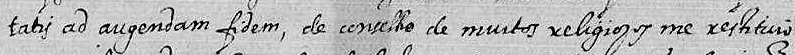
tatis ad augendam fidem, de conselho de muitos religiozos me restituio
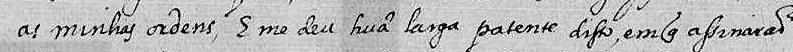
as minhas ordens, E me deu huā larga patente disso, em q̄ assinaraõ
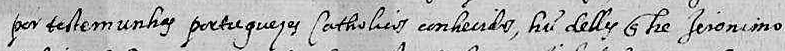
por testemunhas portuguezes Catholicos conhecidos, hū delles q̄ he Jeronimo
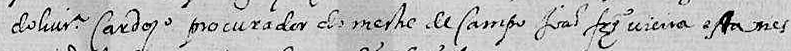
doliur.a Cardozo procurador do mestre de Campo Joaõ frz̄ uieira esta nes
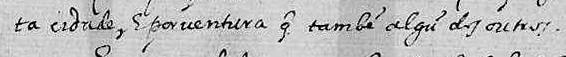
ta cidade, E poruentura q̄ tambē algū dos outros
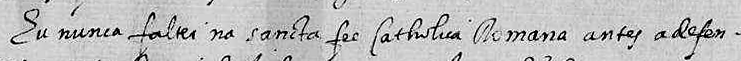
Eu nunca faltei na sancta fee Catholica Romana antes a defen
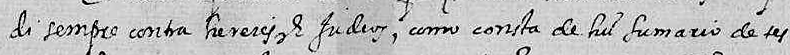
di sempre contra hereies, E Judeos, como consta de hū sumario de tes
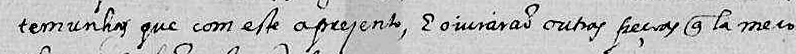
temunhas que com este aprezento, E o iuraraõ outras peçoas q̄ la me co
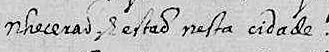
nheceraõ, E estaõ nesta cidade.
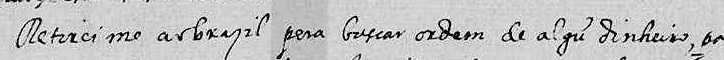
Retirei me ao brazil pera buscar ordem de algū dinheiro, ꝑa
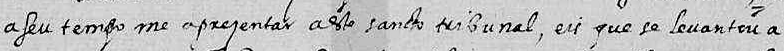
a seu tempo me aprezentar a este sancto tribunal, eis que se leuantou a
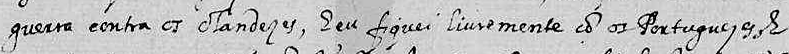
guerra contra os olandezes, E eu fiquei liuramente cō os Portuguezes, E
